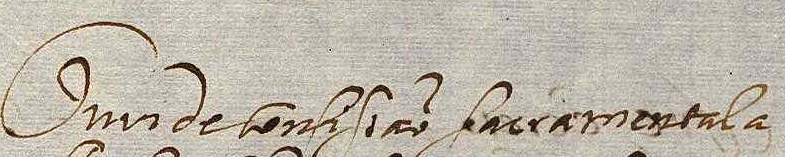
Ouvi de confissaõ sacramental a
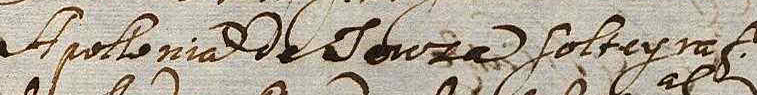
Apollonia de Souza solteyra f.a
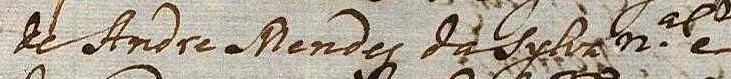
de Andre Mendes da Sylva n.al e
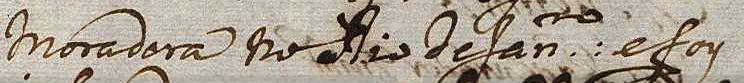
moradora no Rio de Jan.ro: e foy
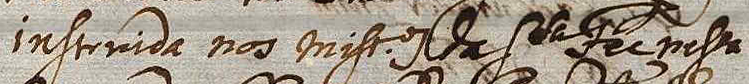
instruida nos mist.os da sta Fee nesta
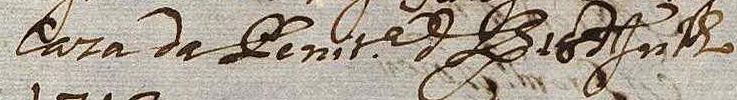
caza da Penit.a d̄ Lx 18 d̄ Julho
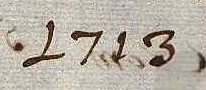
1713
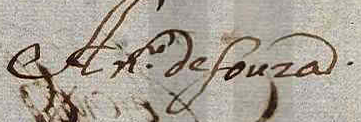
An.to de souza.
